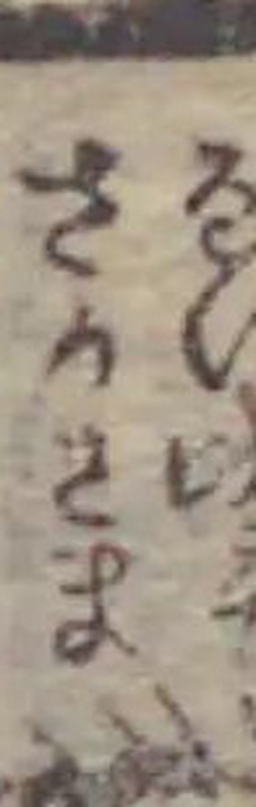さかさま
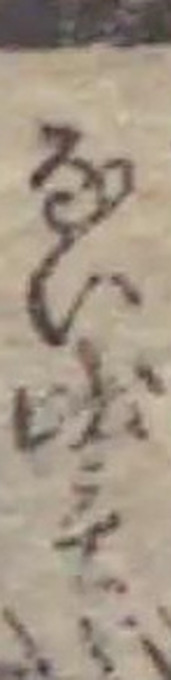ない咄にて
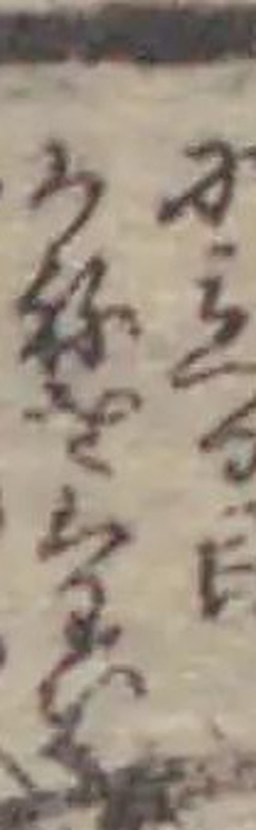かねをくわい
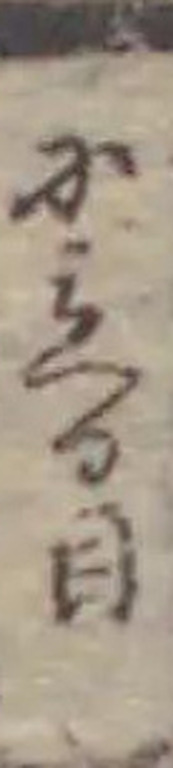にみへる目
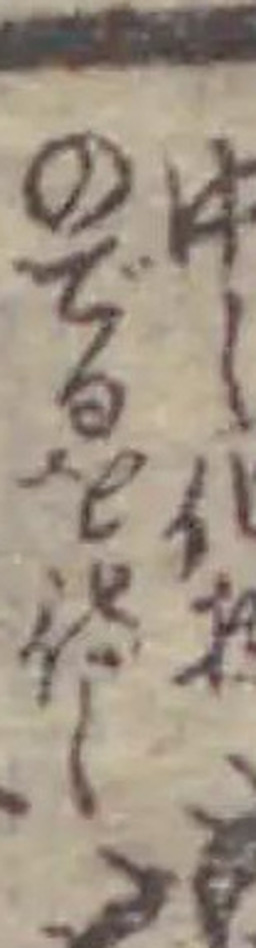のでるを待し
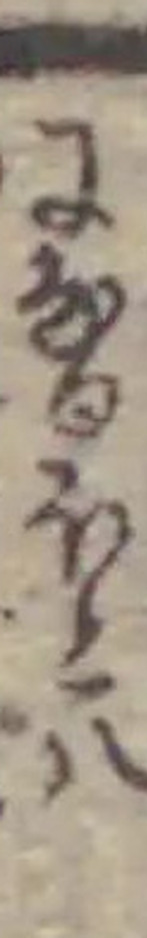になるほと八
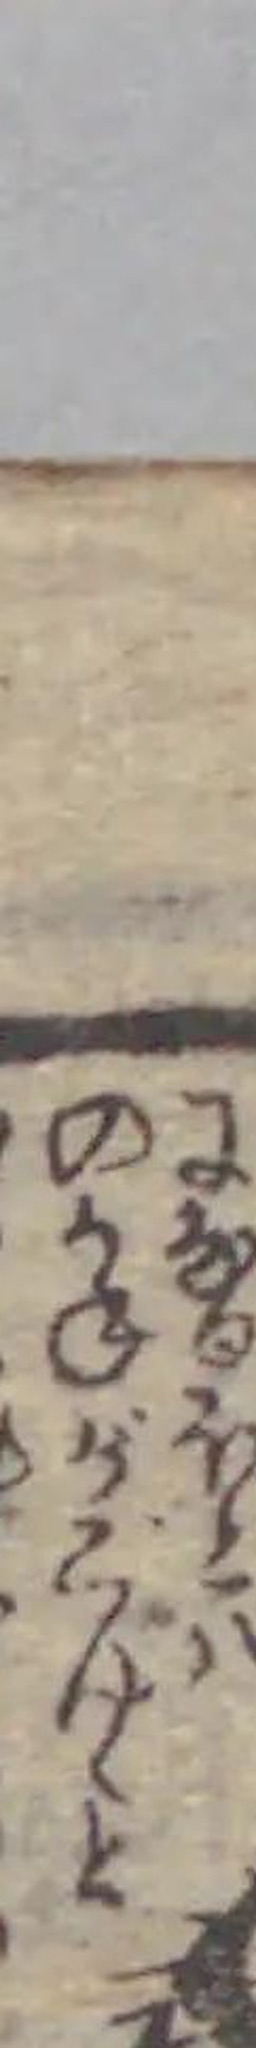のかねがごん〳〵と
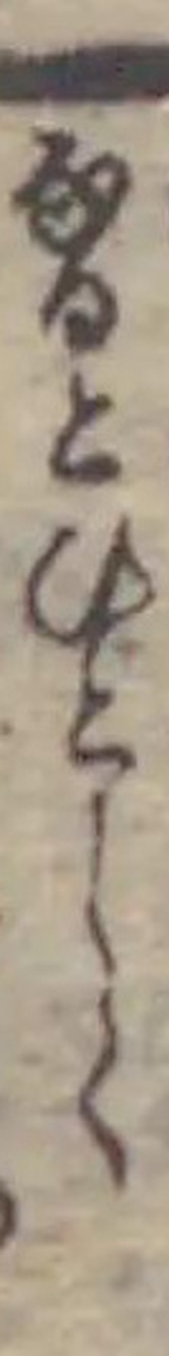なるとひとしく
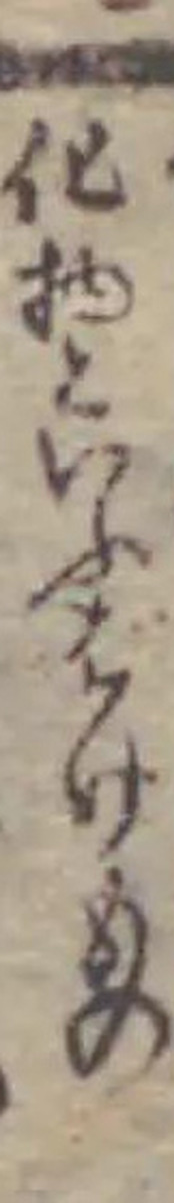化物といふばけもの
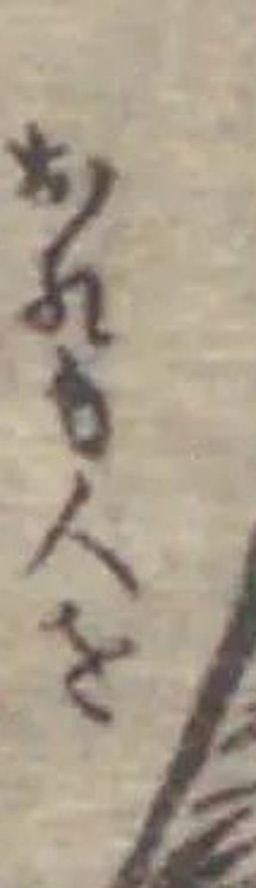おれも人を
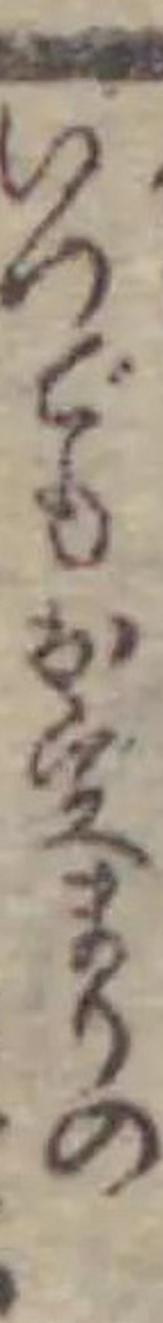いつでもお定まりの
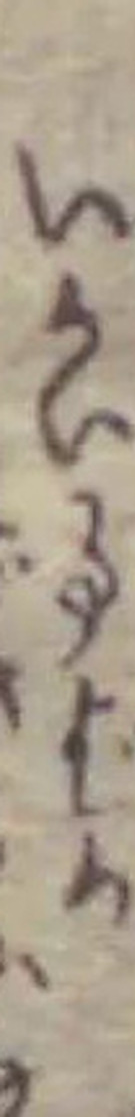いかい事ばか
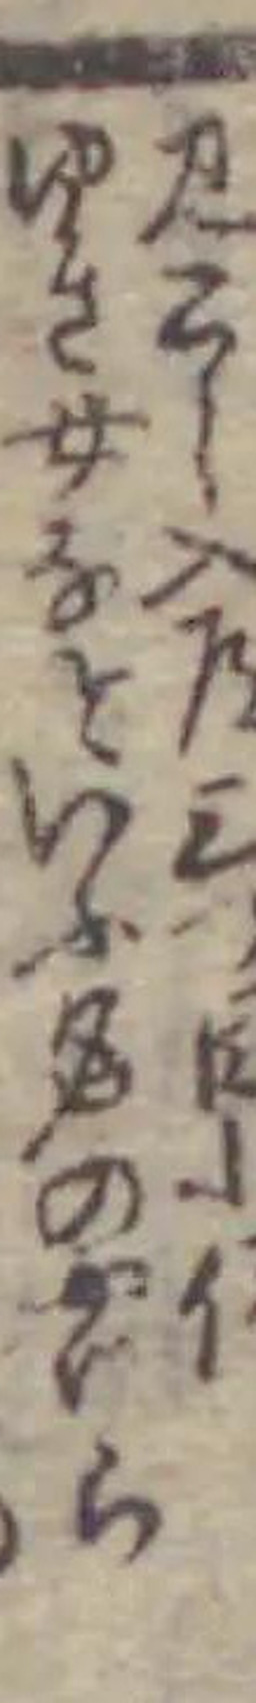ゆき女なといふ名のやつら
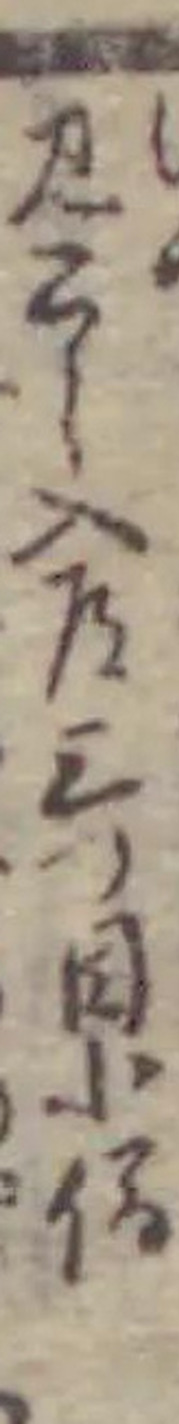見こし入道三つ目小僧
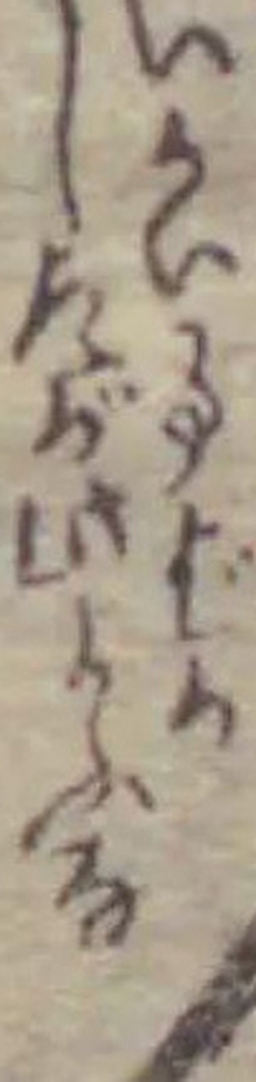したが此よふな
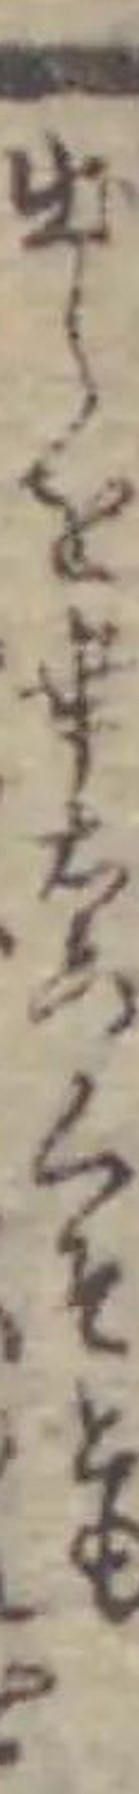出しを幸右衛門くそとも
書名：栄増眼鏡徳 3巻
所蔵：国立国会図書館 National Diet Library, JAPAN
